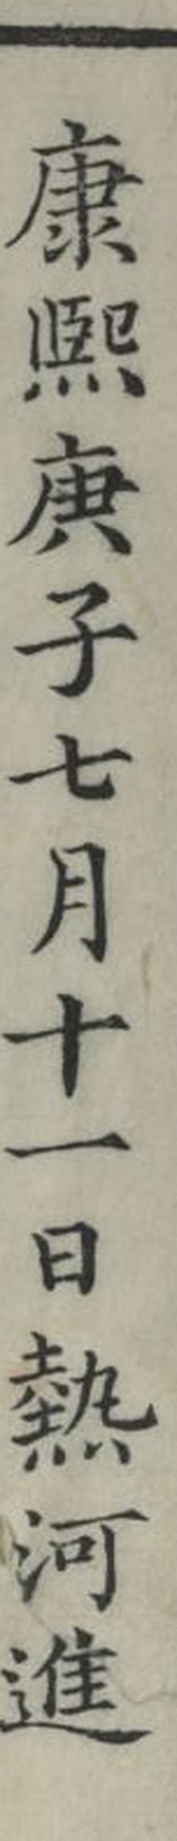康熈庚子七月十一日熱河進
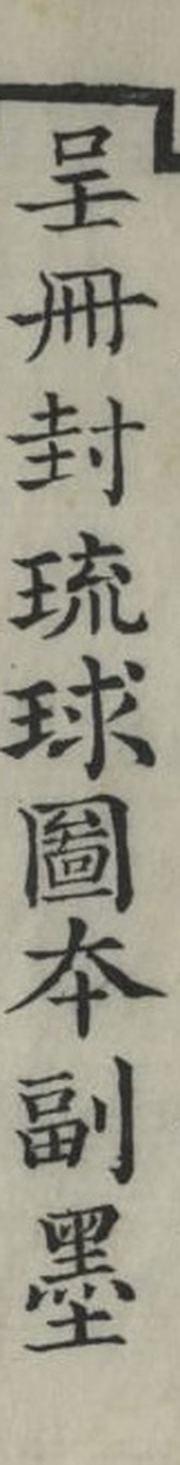呈冊封琉球圗夲副墨
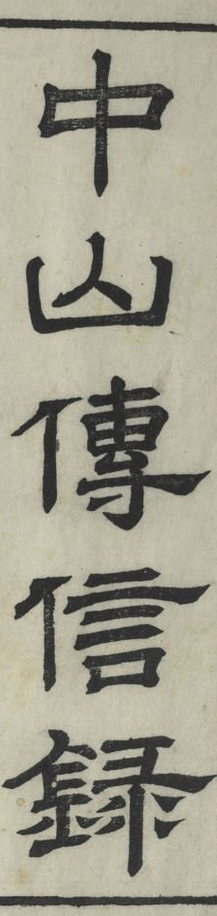中山傳信録
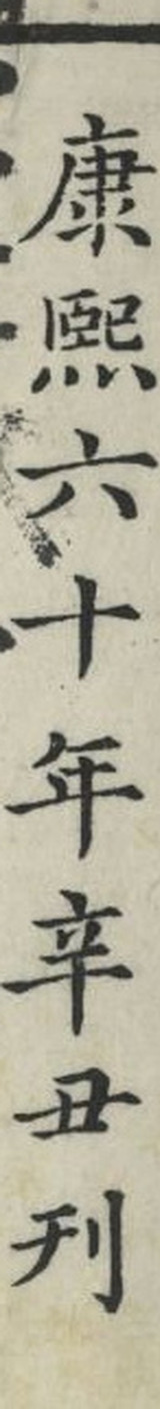康熙六十年辛丑刊
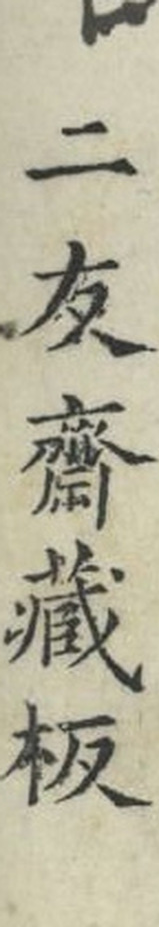二友齋藏板
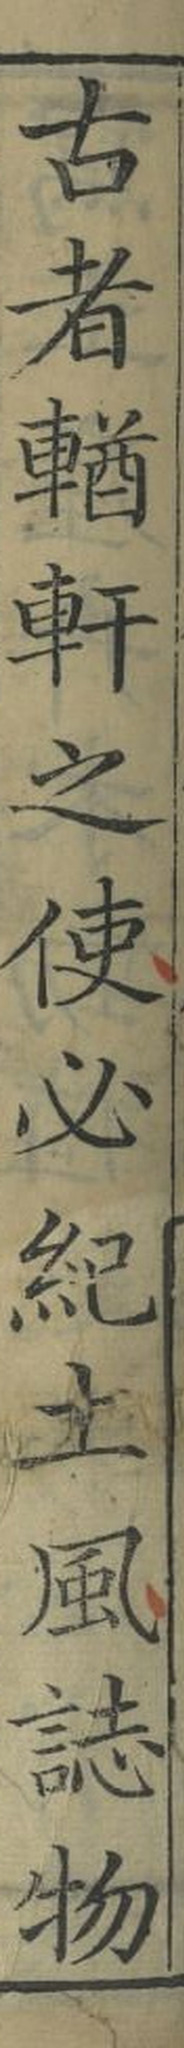古者輶軒之使必紀土風誌物
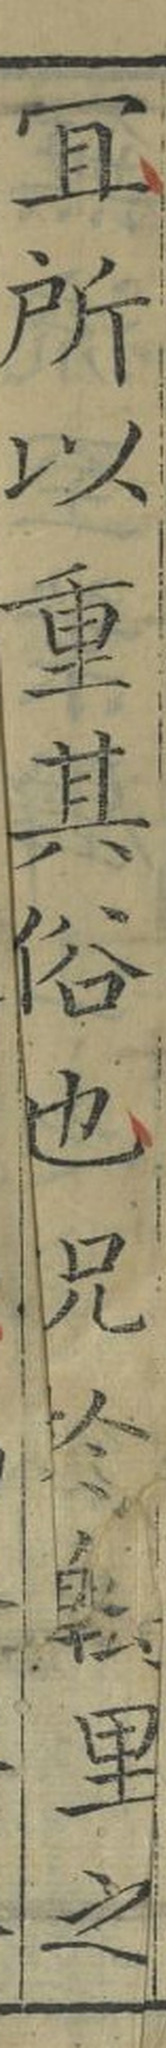冝所以重其俗也况扵萬里之
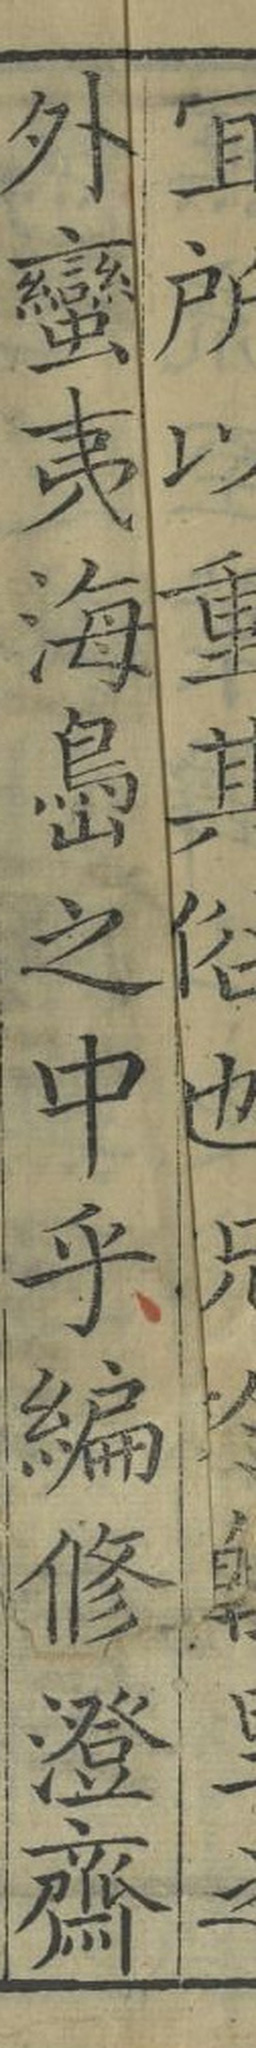外蠻夷海㠀之中乎編修澄齋
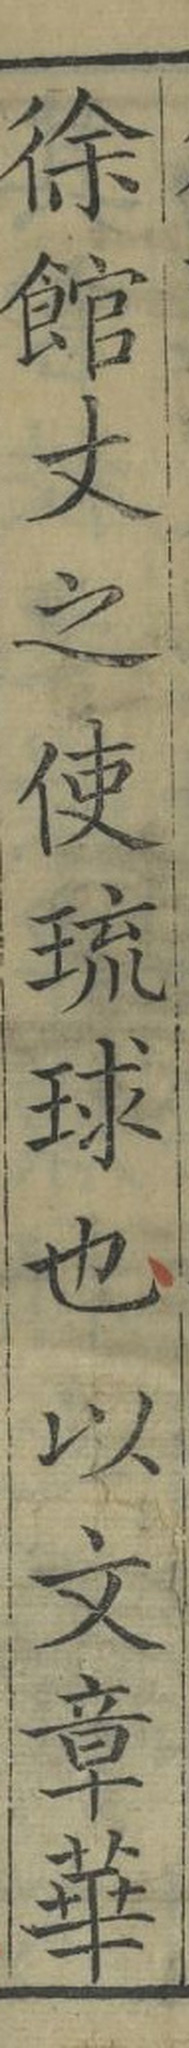徐館丈之使琉球也以文章華
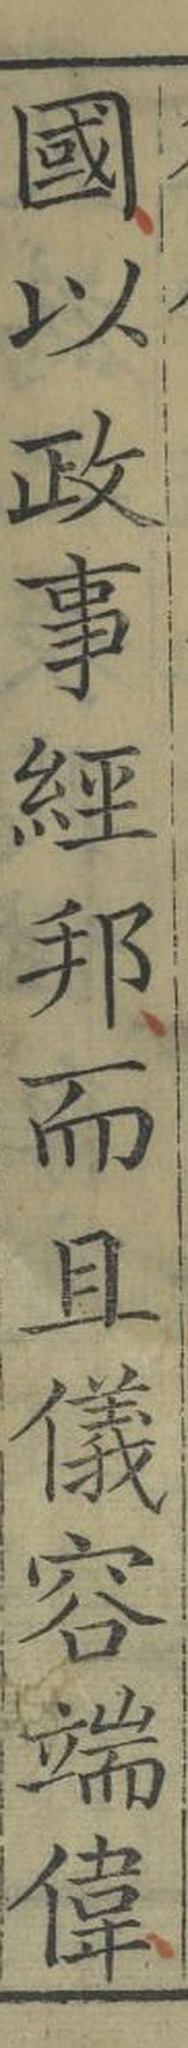國以政事經邦而且儀容端偉
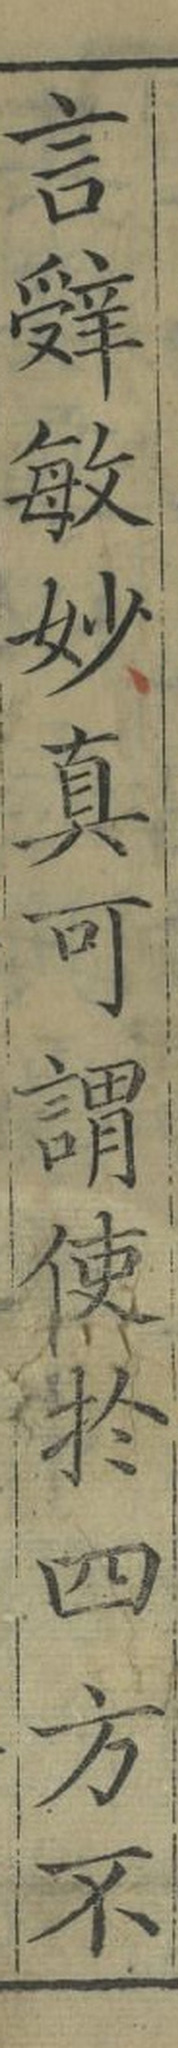言辤敏妙真可謂使扵四方不
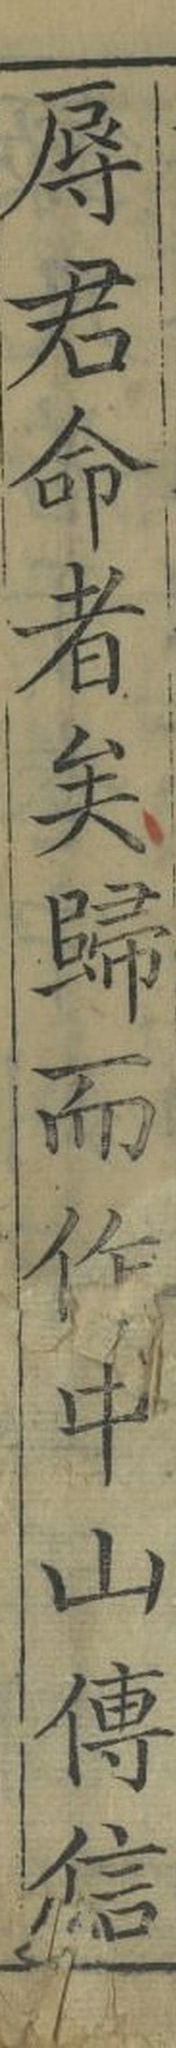辱君命者矣歸而作中山傳信

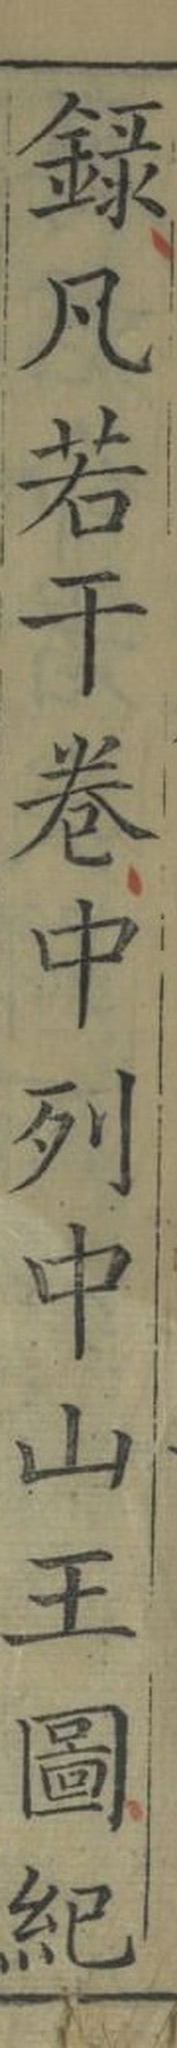録凡若干巻中列中山王圖紀
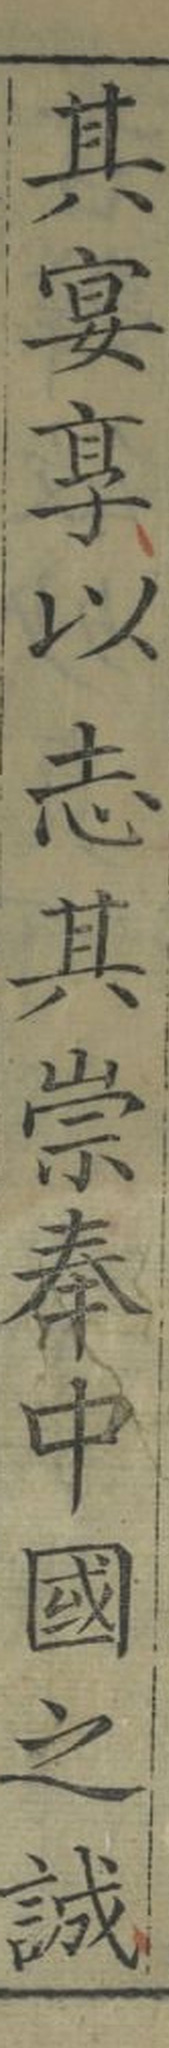其宴享以志其崇奉中國之誠
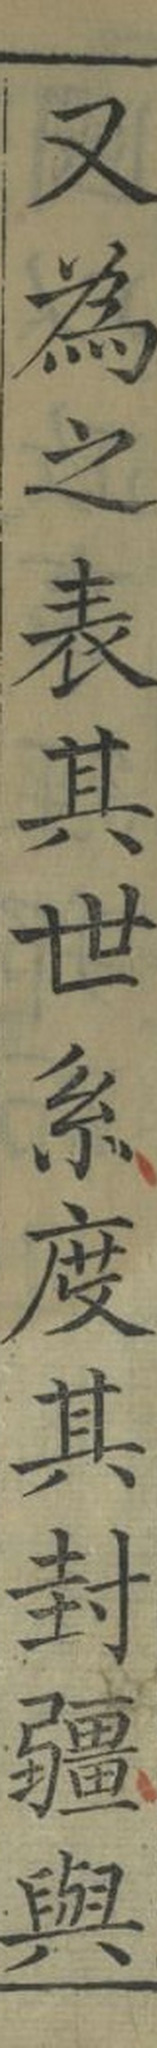又為之表其世系度其封疆與
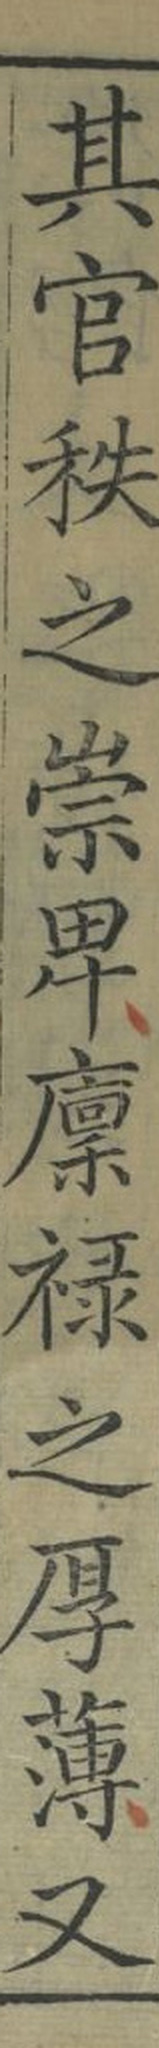其官秩之崇卑廩禄之厚薄又
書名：中山伝信録 巻一、巻二
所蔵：University of the Ryukyus Library
